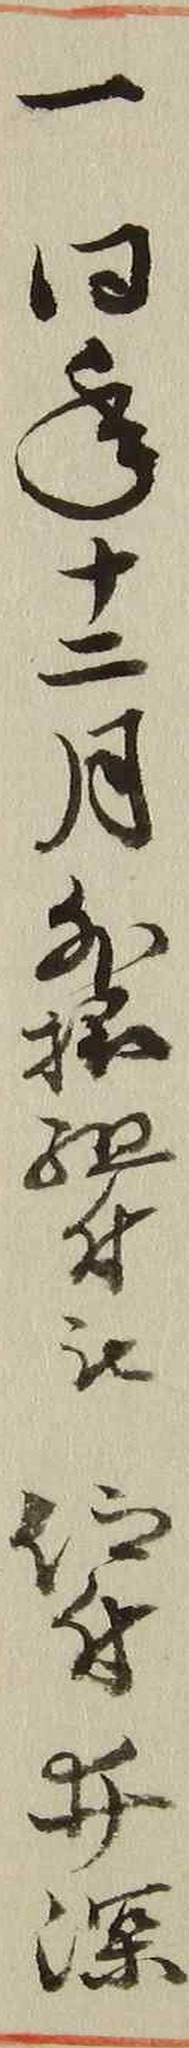一同年十二月外様組付被仰付井深
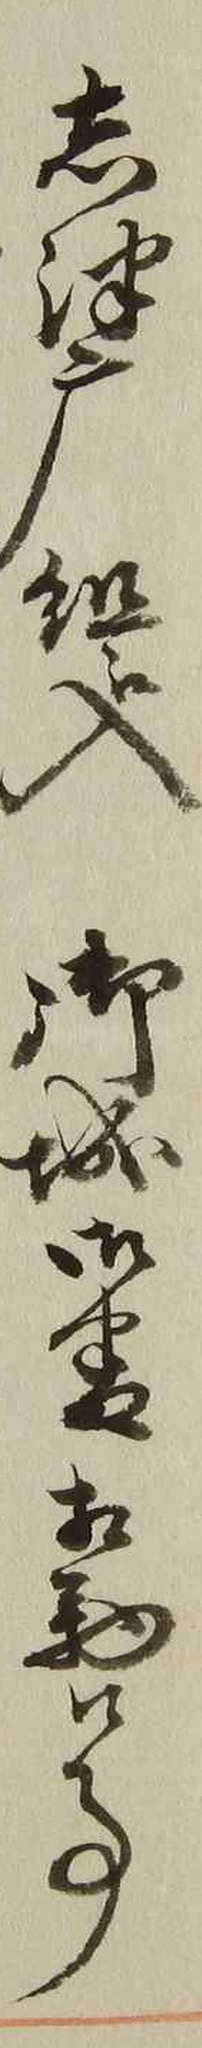志津摩組江入御城御番相勤候事
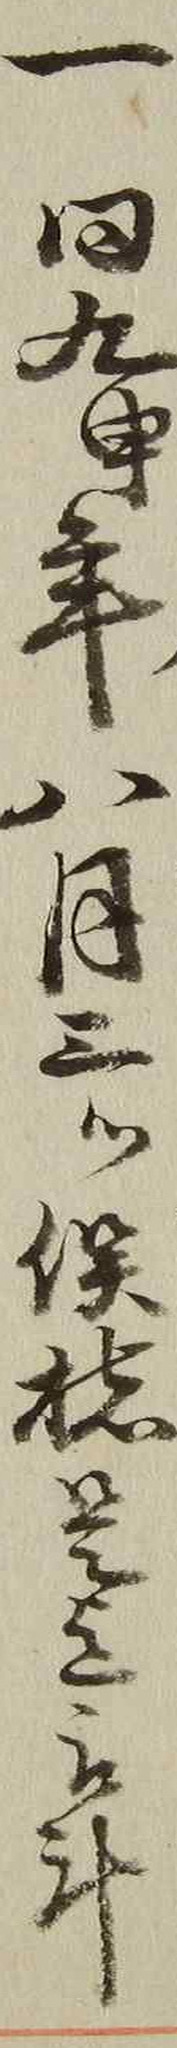一同九申年八月三ツ俣楮是迄取計
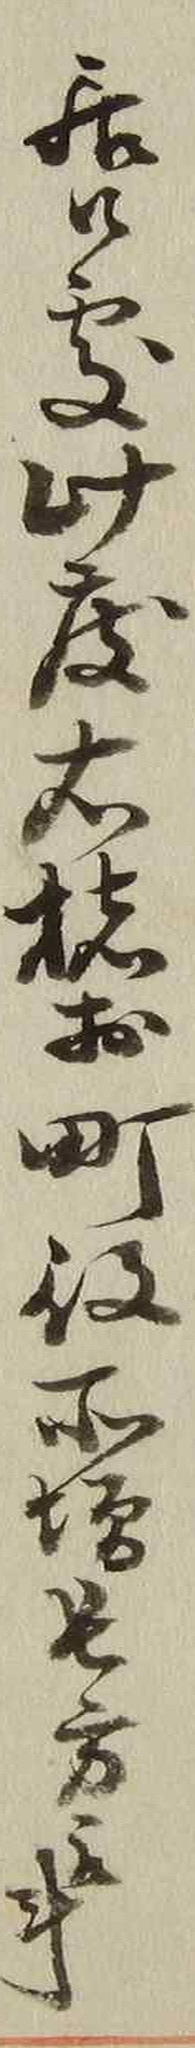居候処此度右楮於町役所増長方取計
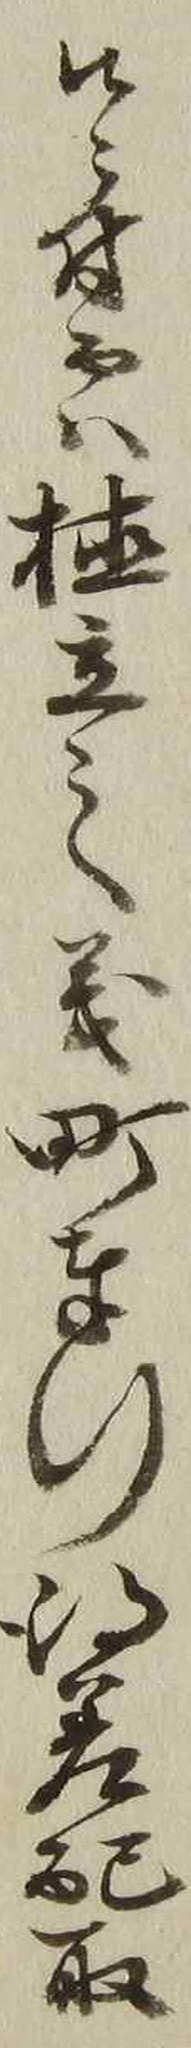候ニ付而ハ植立之義町奉行得差配取
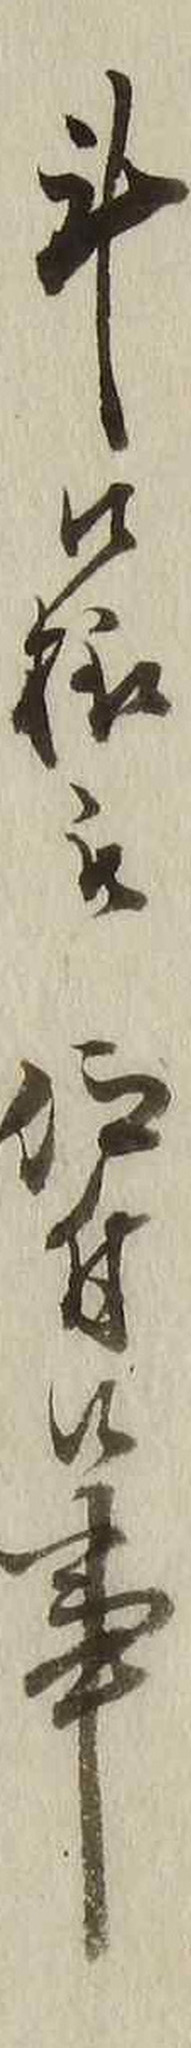計候様被仰付候事
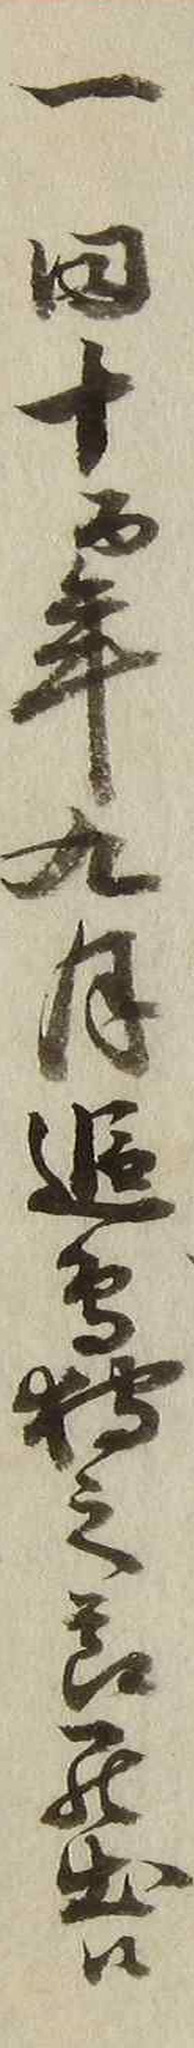一同十酉年九月追鳥狩之節罷出候
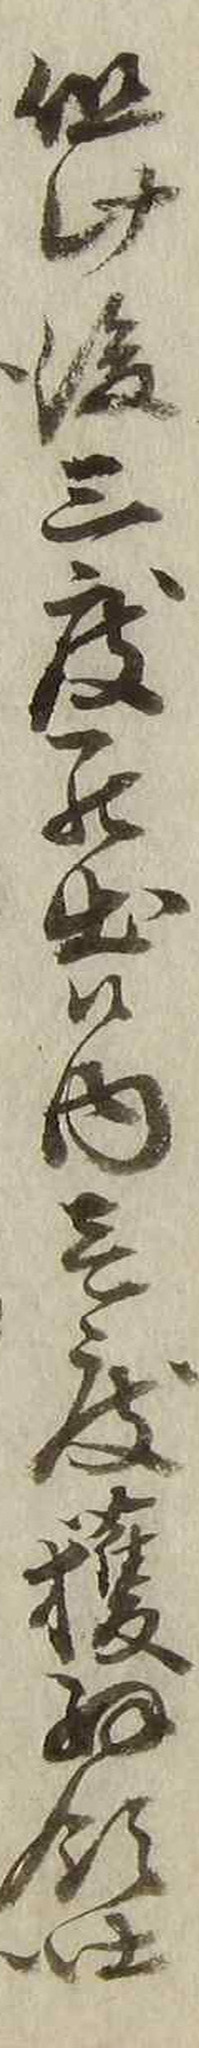但此度三度罷出候内壱度獲拝領仕
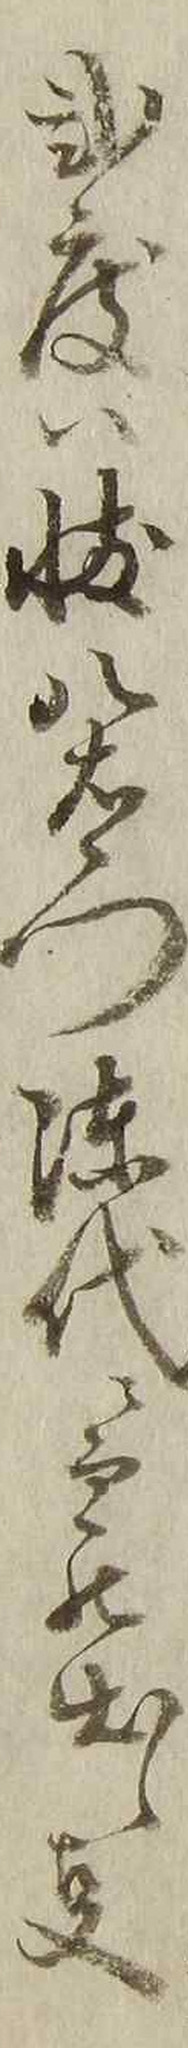弐度ハ忰八右衛門陣代ニ而罷出候事
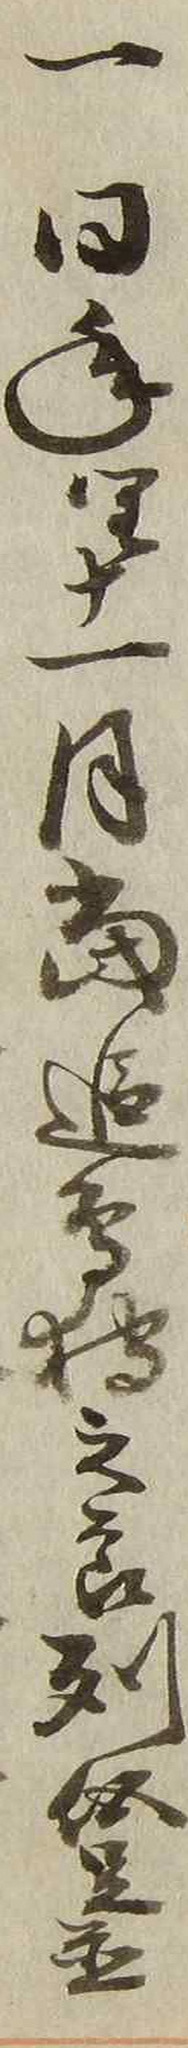一同年閏十一月当追鳥狩之列伍足並
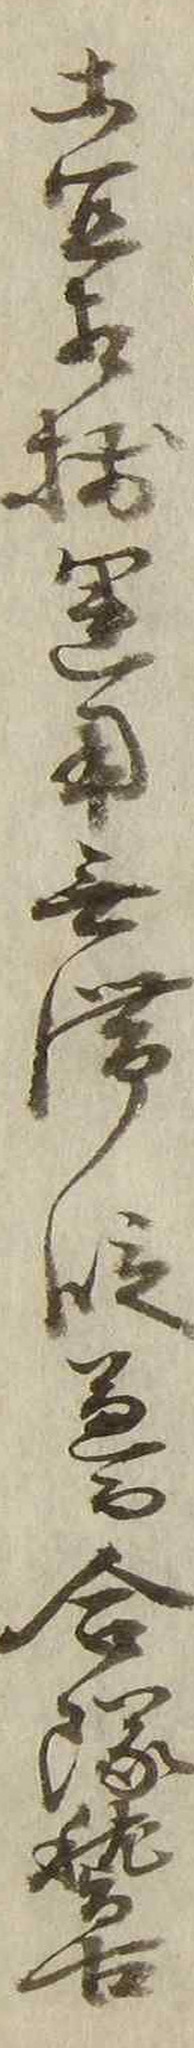等宜相揃運用無滞段兼而合隊稽古

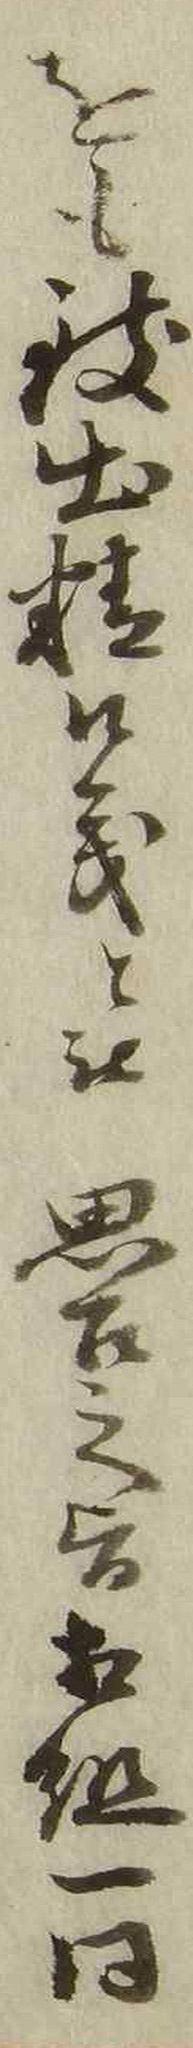をも致出精候義と被思召之旨相組一同
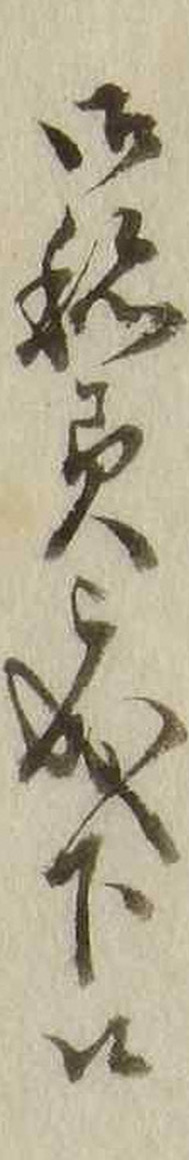御称美被成下候
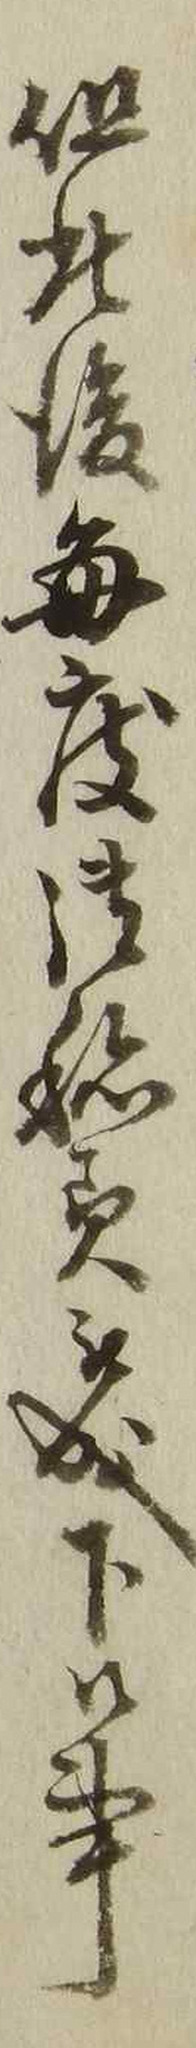但此以後毎度御称美被成下候事
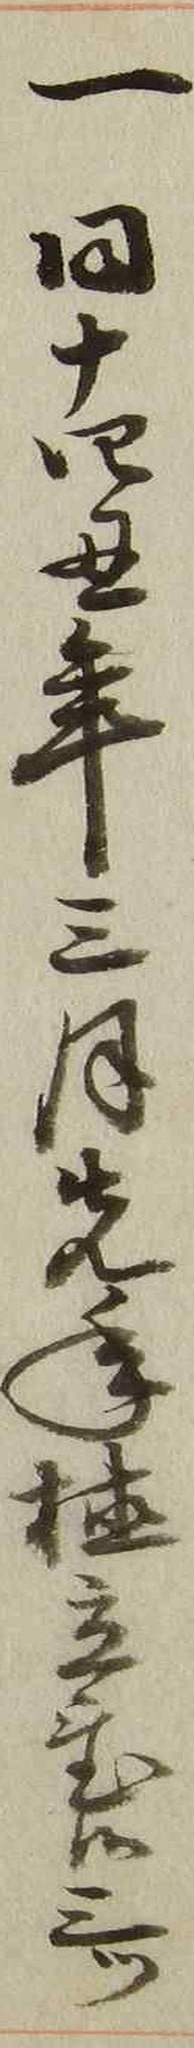一同十四丑年三月先年植立置候三ツ
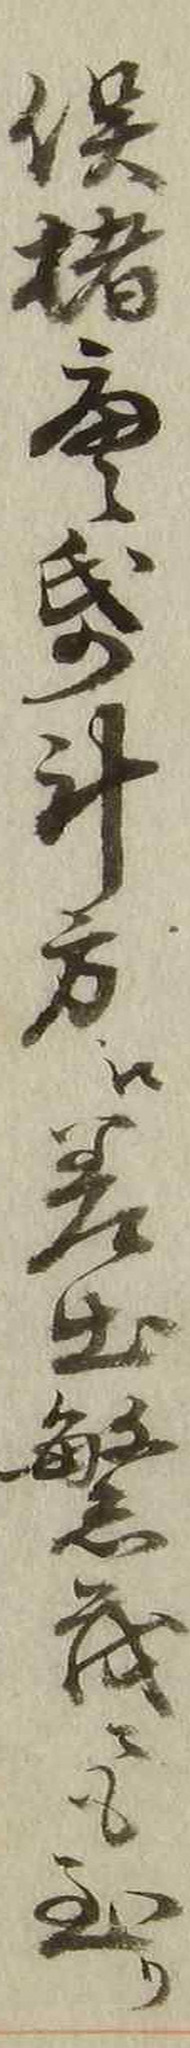俣楮唐紙計方江差出繁茂ニも至リ
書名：諸士系譜　巻之31　い之部31
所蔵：会津若松市立会津図書館
